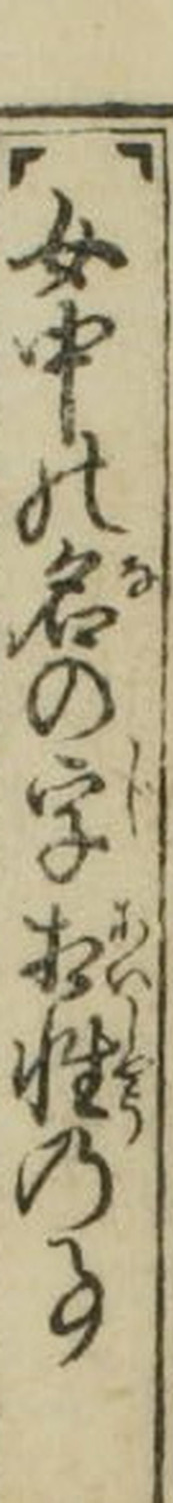女中の名の字相性の事
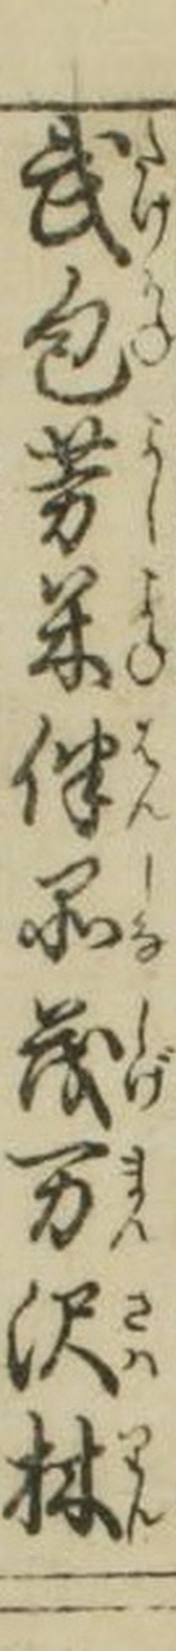武包芳米伴品茂万沢林
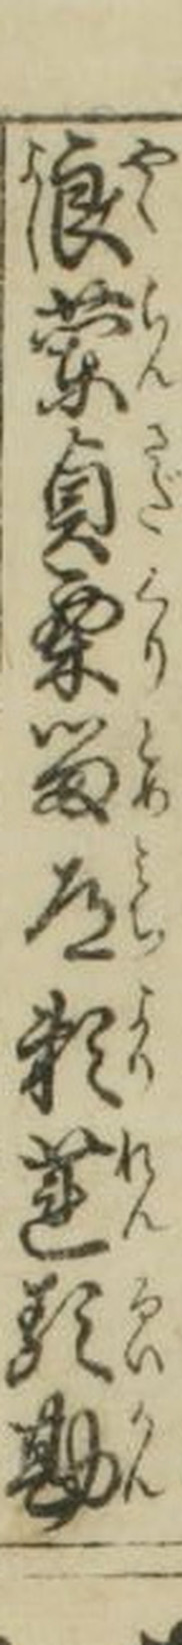良蘭貞栗留道頼蓮類勘
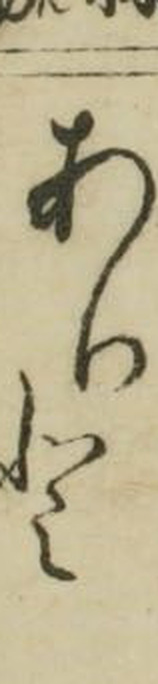ありと
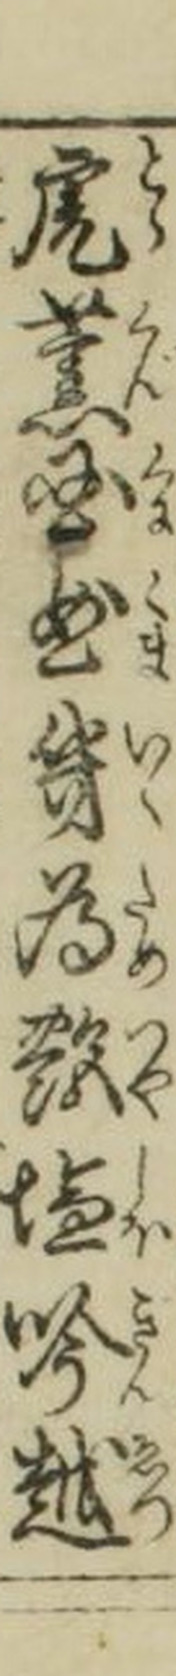虎薫国曲幾為艶塩吟越
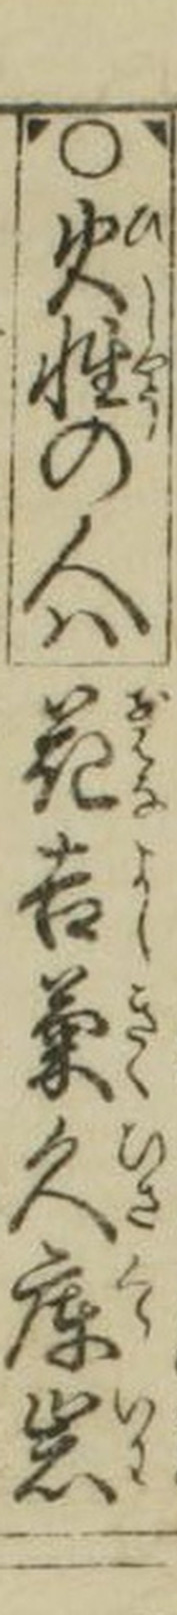◯火性の人は花吉菊久庫岩
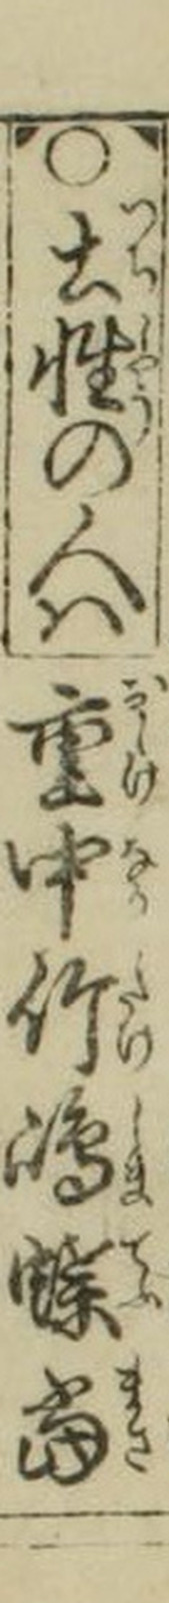◯土性の人は重中竹島蝶当
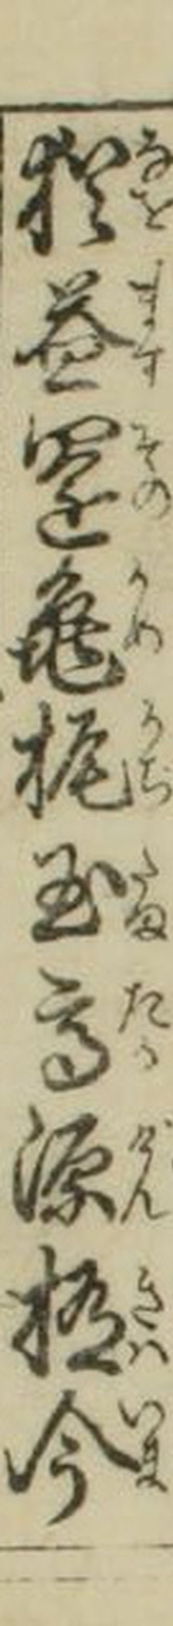猶益園亀梶玉高源極今
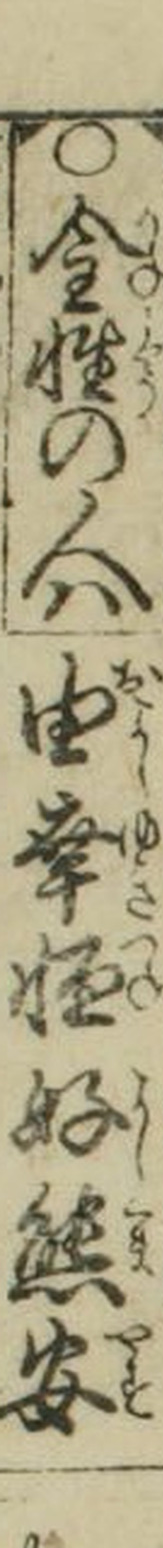◯金性の人は由幸恒好熊安
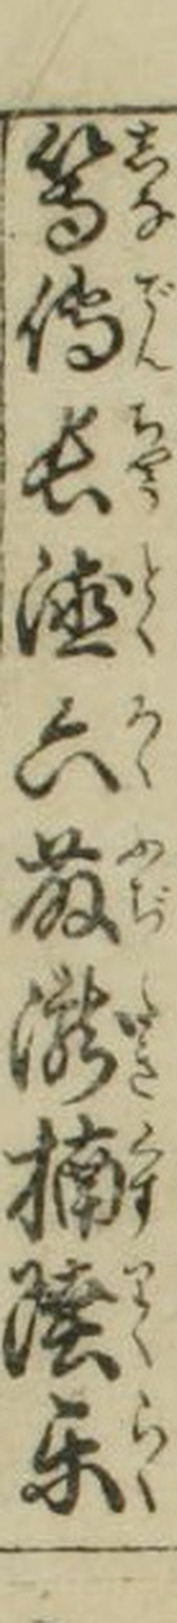等伝長徳六藤瀧楠陸楽
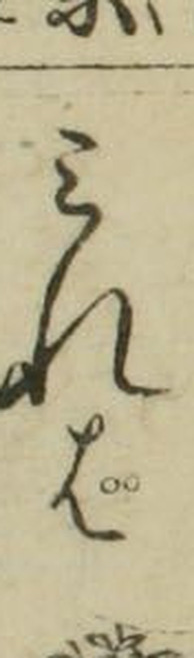みれば
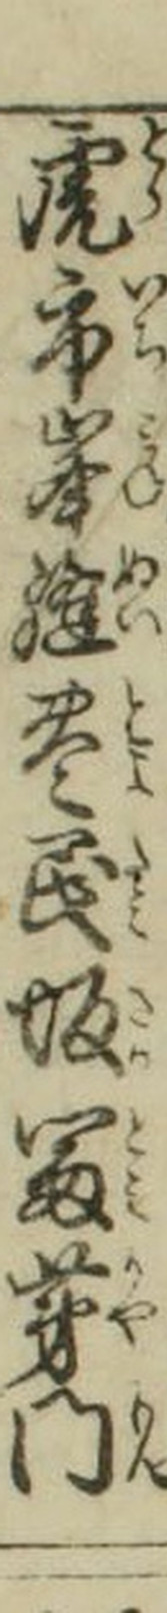虎市峯縫豊民坂冨茅門
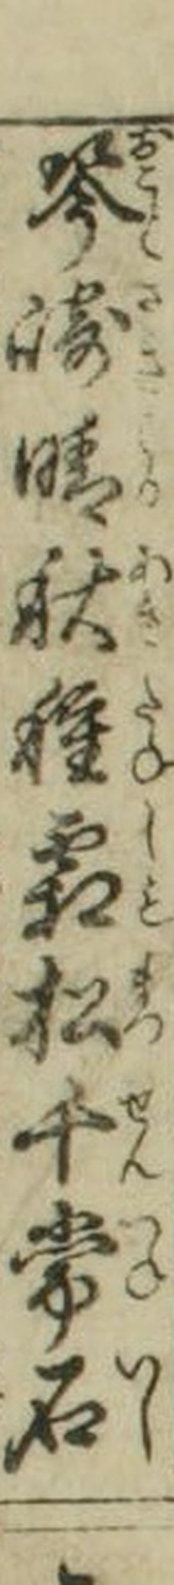琴崎晴秋種霜松千常石
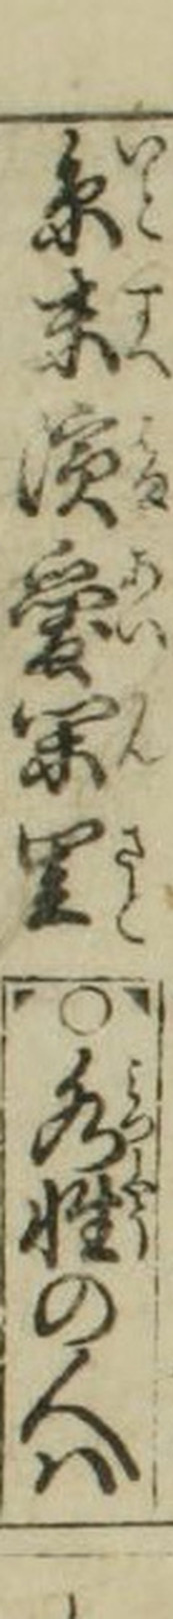糸末浜愛閑里◯水性の人は
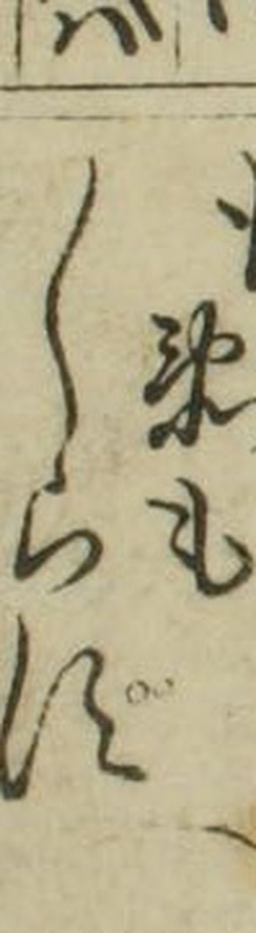しらず
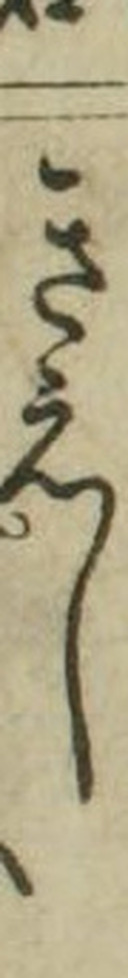きえし
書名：女源氏教訓鑑
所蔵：東京学芸大学附属図書館
